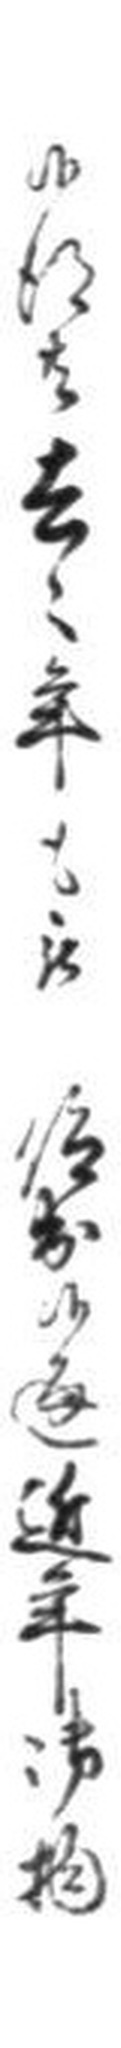候得共去々年も被仰出候通近年御物
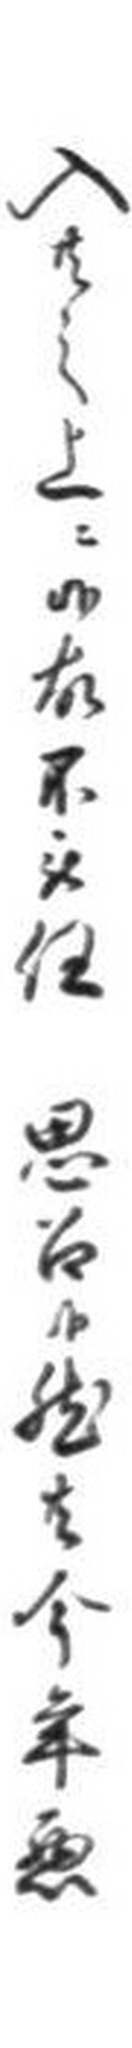入共之上ニ候故不被任思召候然共今年悪
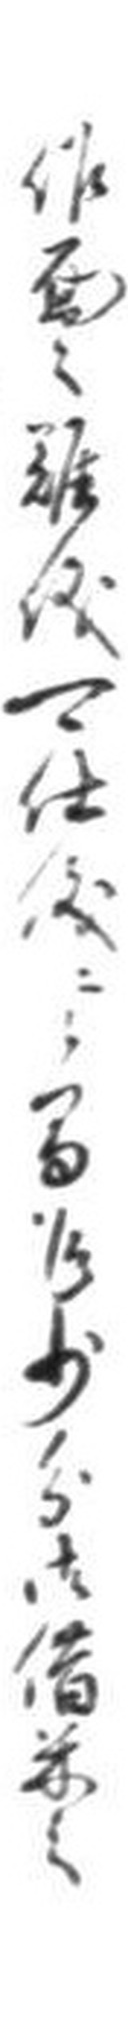作面々難儀可仕儀ニ候間乍少分御借米之
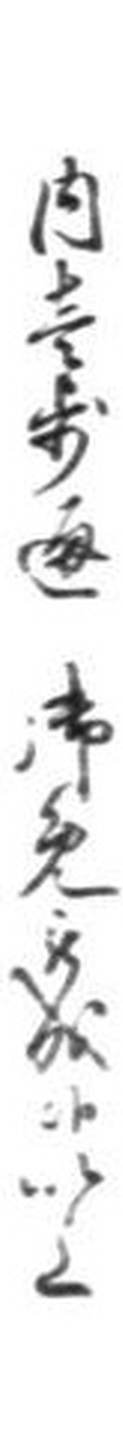内壱歩通御免被成候以上
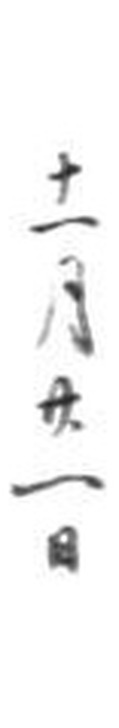十一月廿一日
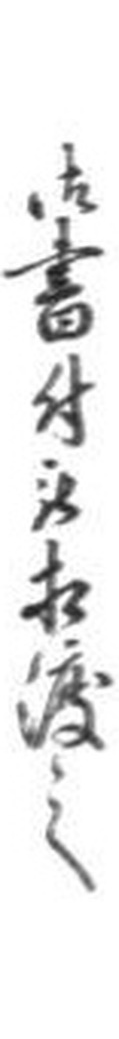御書付被相渡之
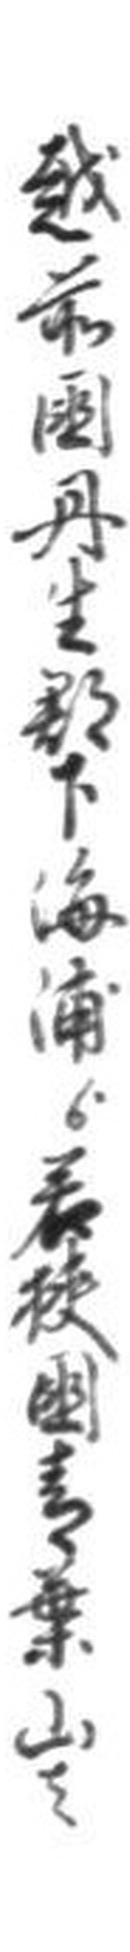越前国丹生郡下海浦ゟ若狭国青葉山者
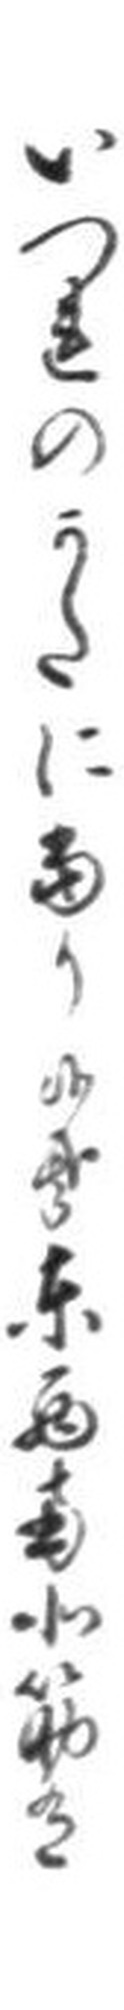いつれのかたに当り候哉東西南北筋有

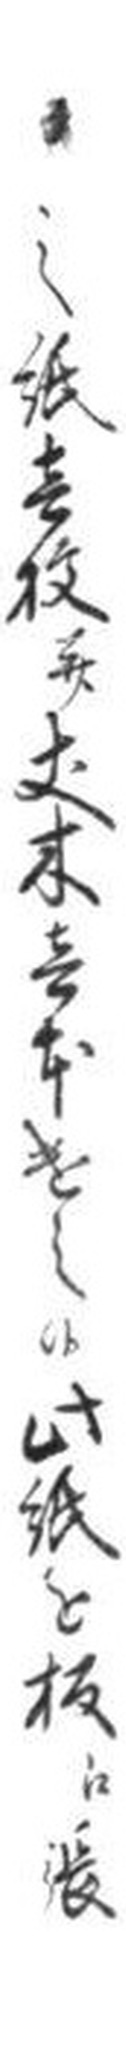之紙壱枚并丈木壱本遣之候此紙を板江張
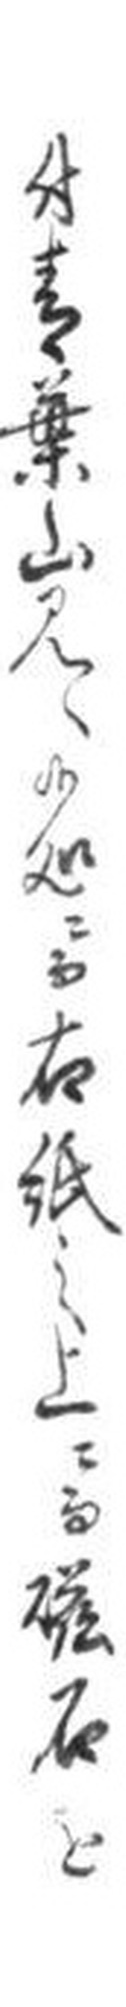付青葉山見へ候処ニ而右紙之上ニ而磁石を
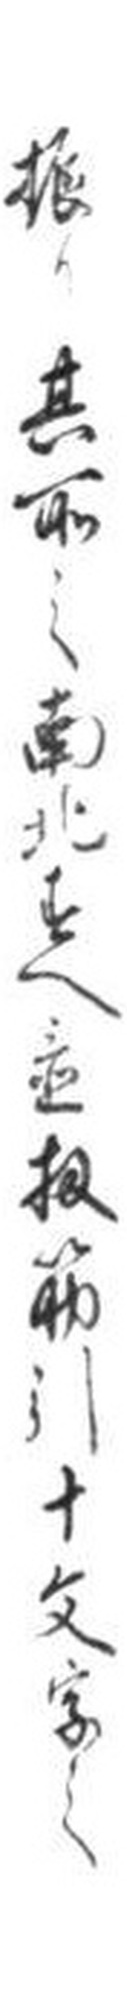振り其所之南北すへ置扨筋引十文字之
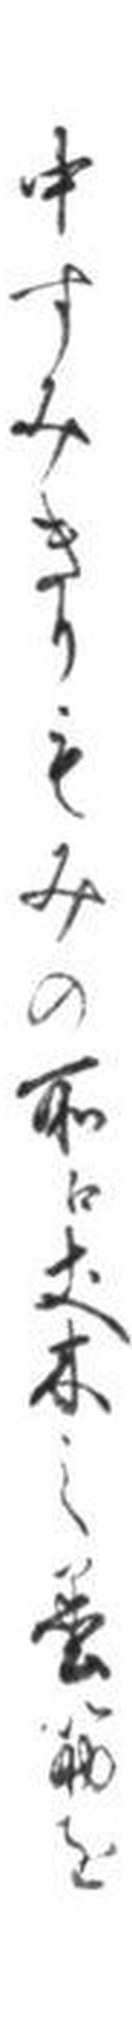中すみきりもみの所江丈木之墨筋を
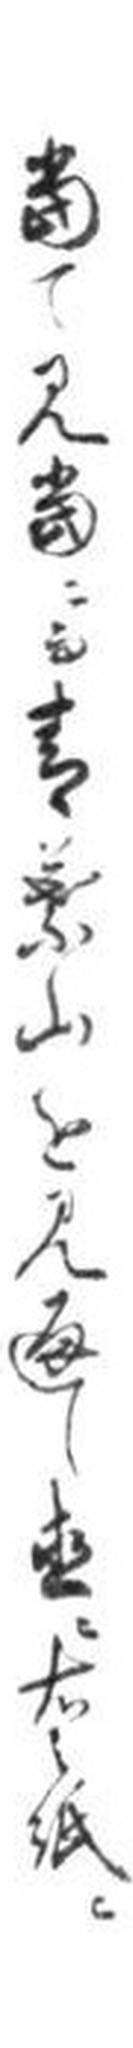当て見当ニ而青葉山を見通し直ニ右之紙ニ
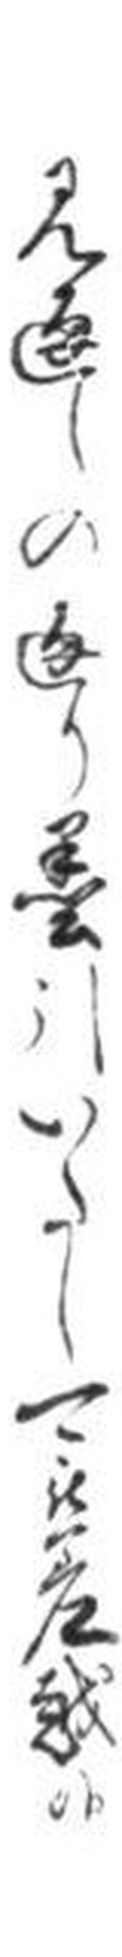見通しの通り墨引いたし可被差越候
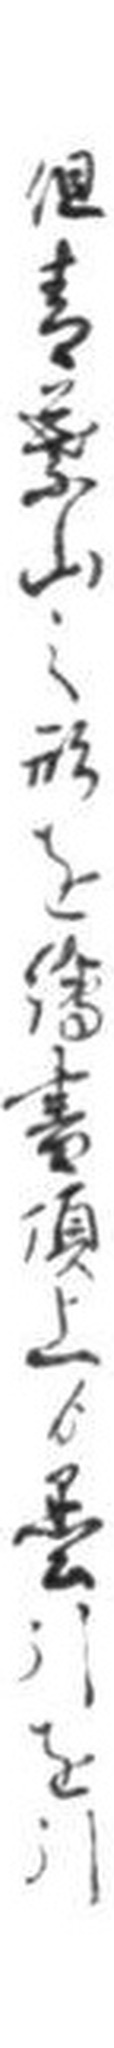但青葉山之形を絵書頂上ゟ墨引を引
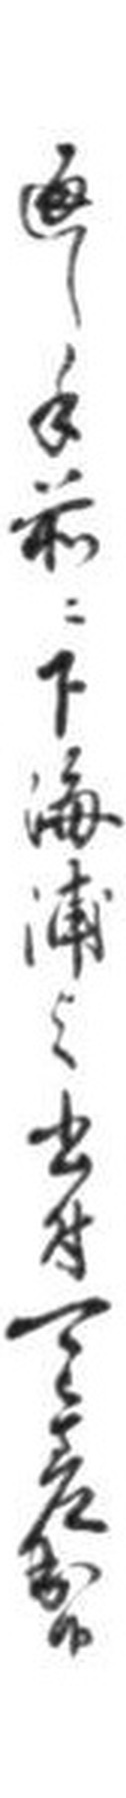通し手前ニ下海浦与書付可被差出候
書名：家譜 三十三 吉邦公 享保四年
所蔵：福井県文書館 Fukui Prefectural Archives
